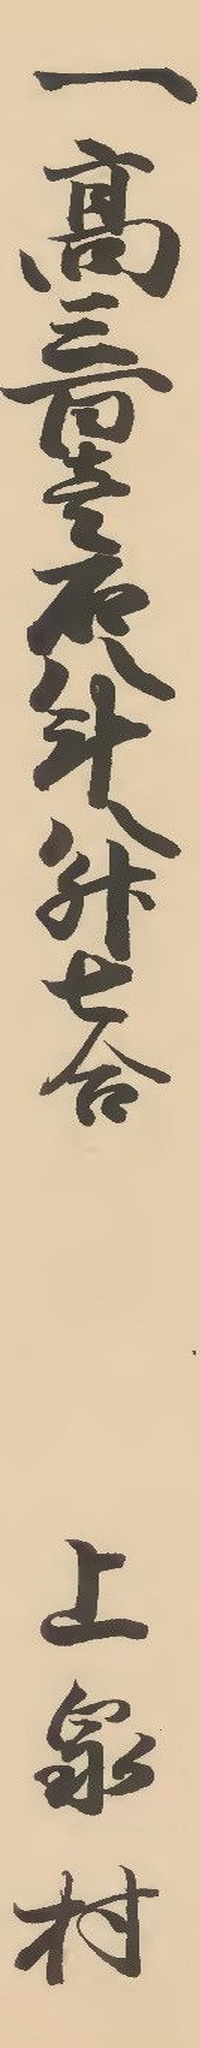一髙三百壱石八斗八升七合上泉村
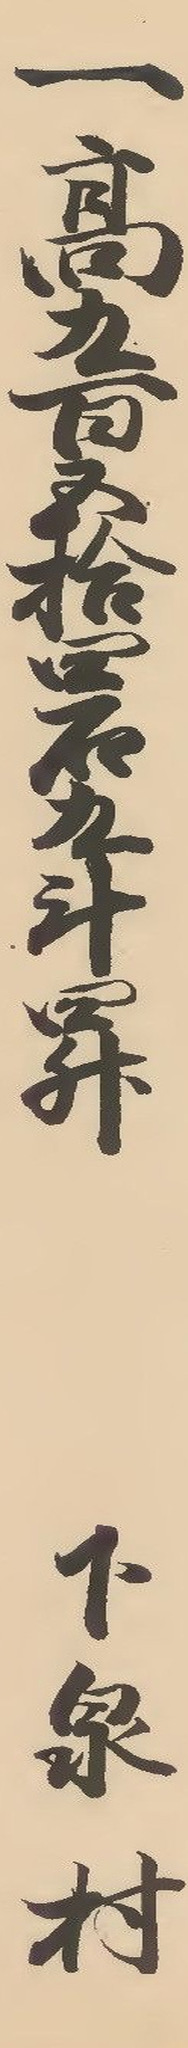一髙九百五拾四石九斗四升下泉村
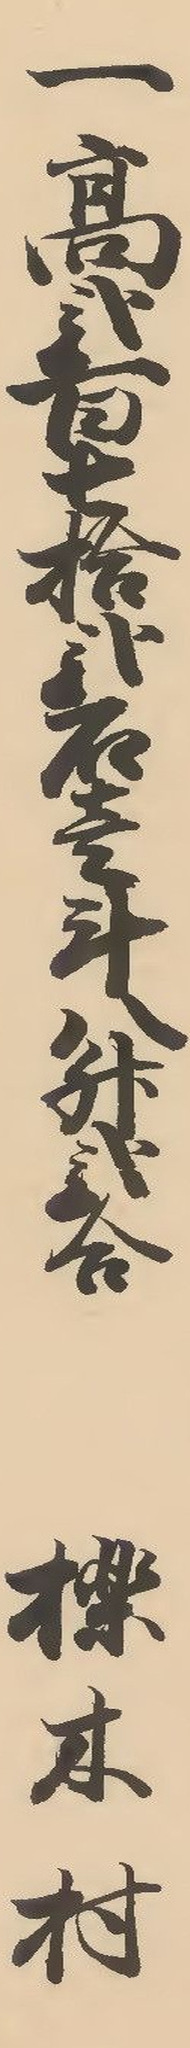一髙弐百七拾弐石壱斗八升弐合櫟木村

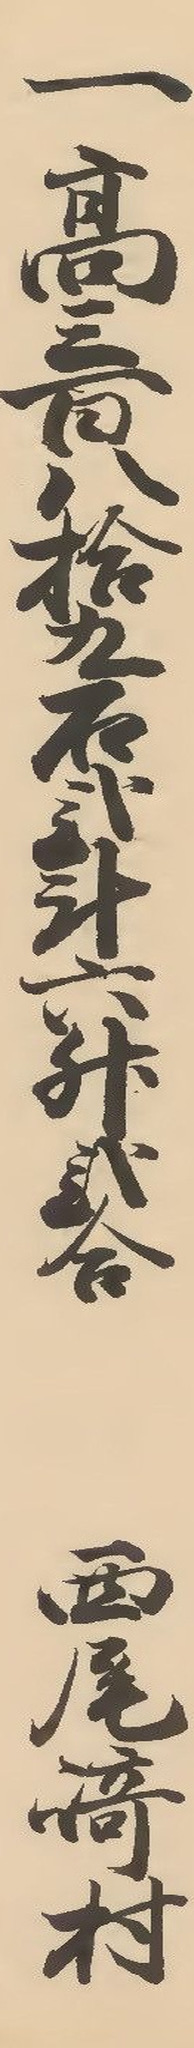一髙三百八拾九石弐斗六升弐合西尾崎村
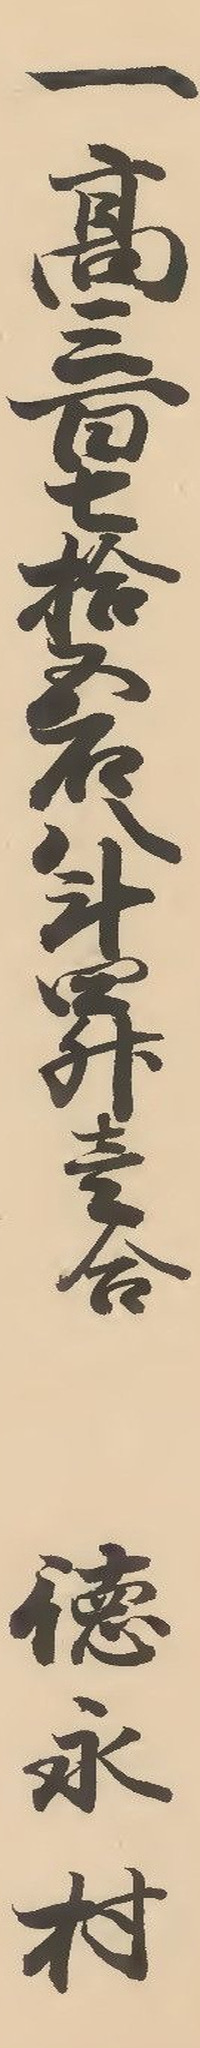一髙三百七拾五石八斗四升壱合徳永村
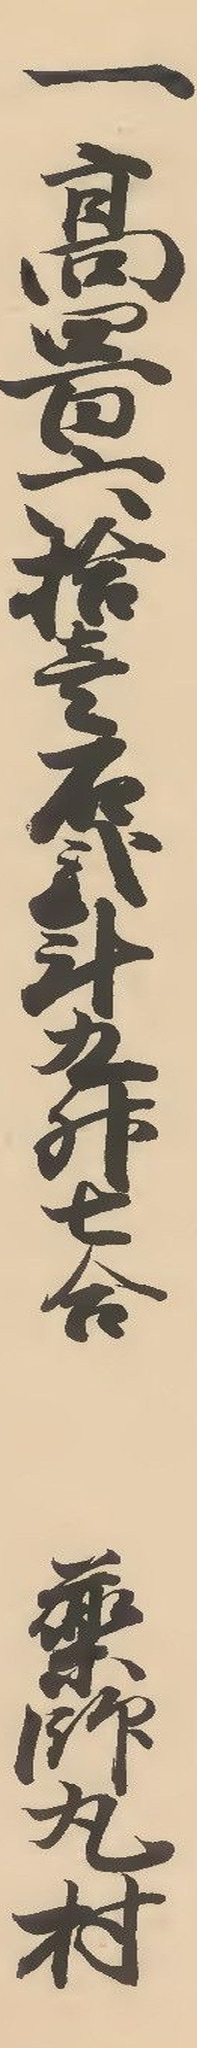一髙四百六拾壱石弐斗九升七合藥師丸村
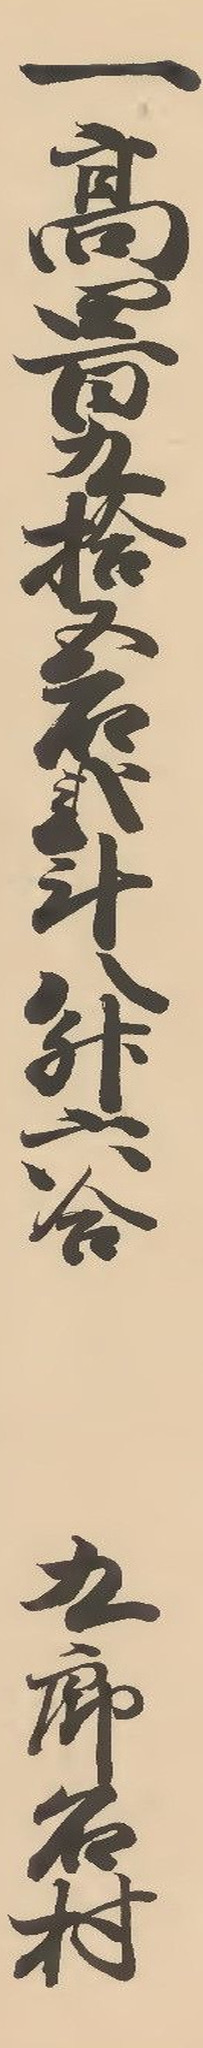一髙四百九拾五石弐斗八升六合九郎名村
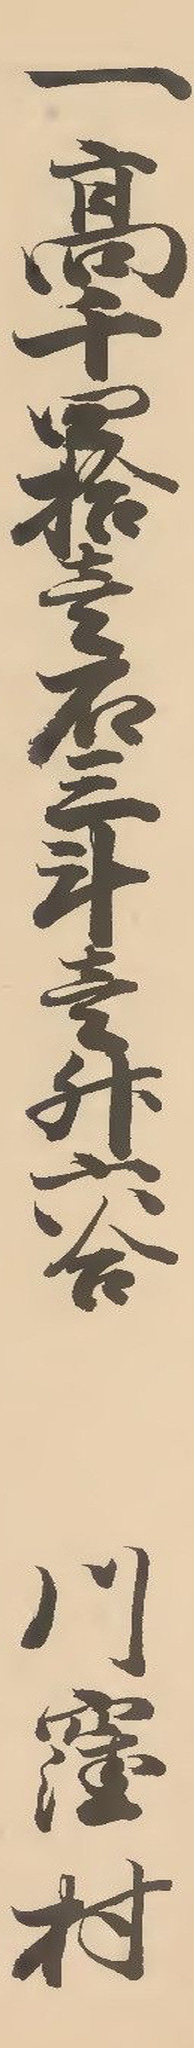一髙千四拾壱石三斗壱升六合川窪村
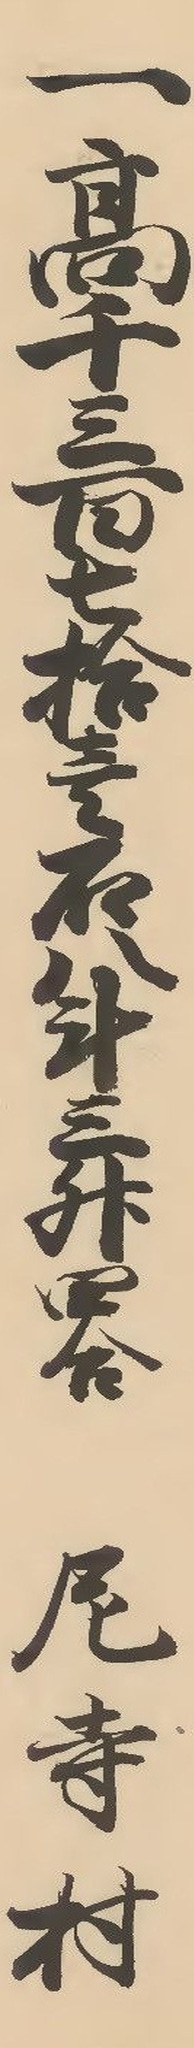一髙千三百七拾壱石八斗三升四合尼寺村
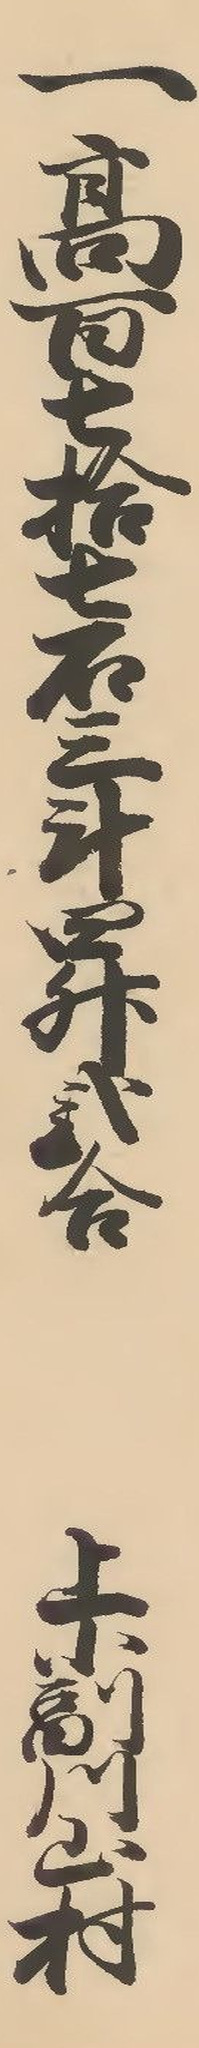一髙百七拾七石三斗四升弐合上小副川山村
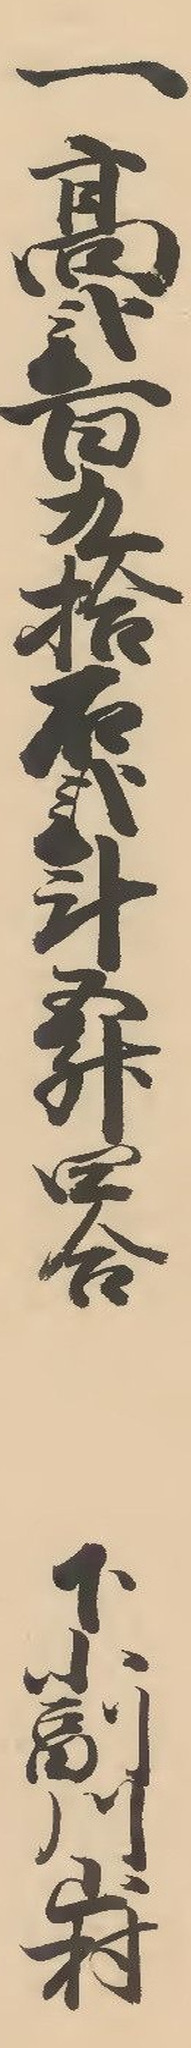一髙弐百九拾石弐斗五升四合下小副川山村

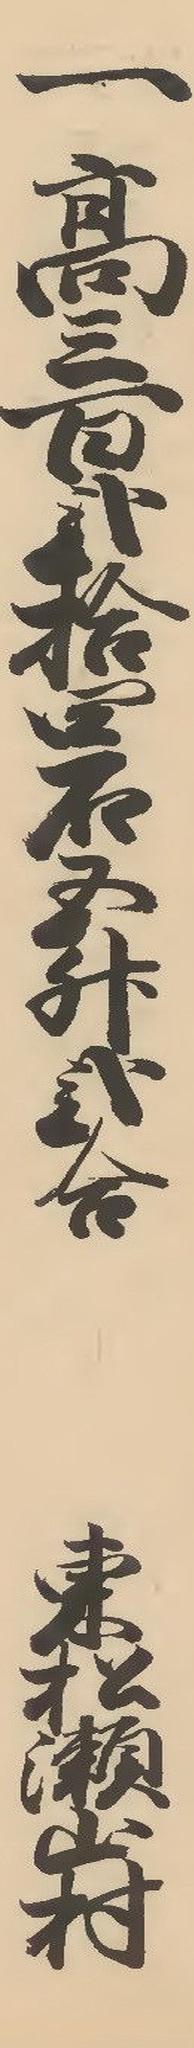一髙三百弐拾四石五升弐合東松瀬山村
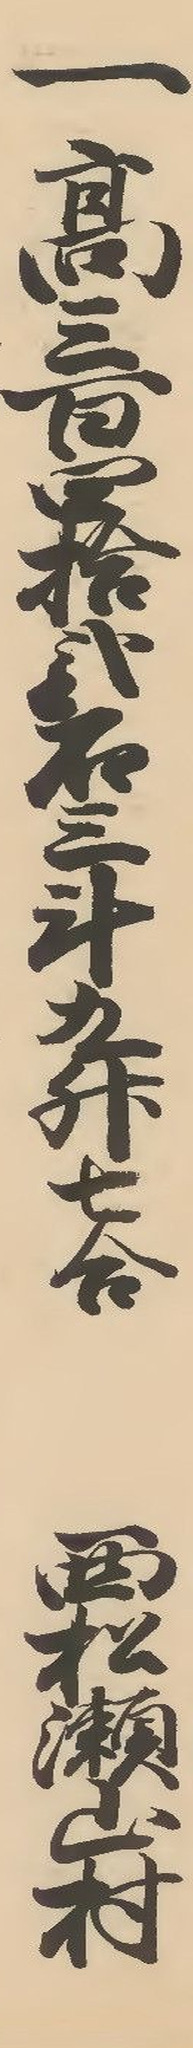一髙三百四拾弐石三斗九升七合西松瀬山村
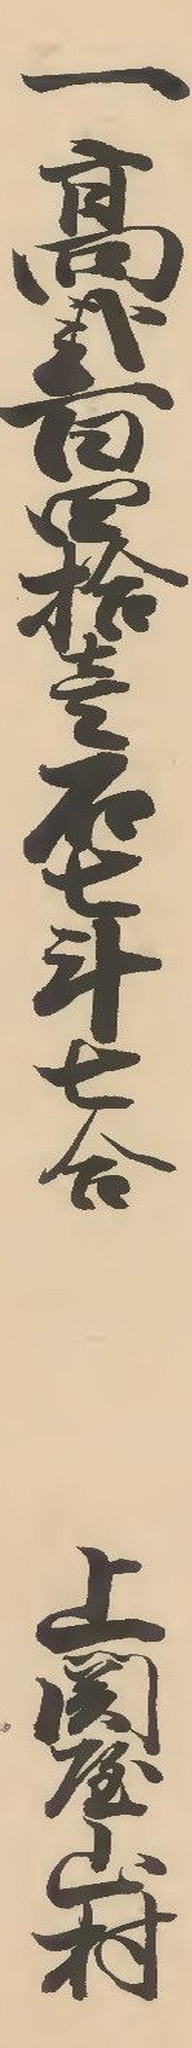一髙弐百四拾壱石七斗七合上関屋山村
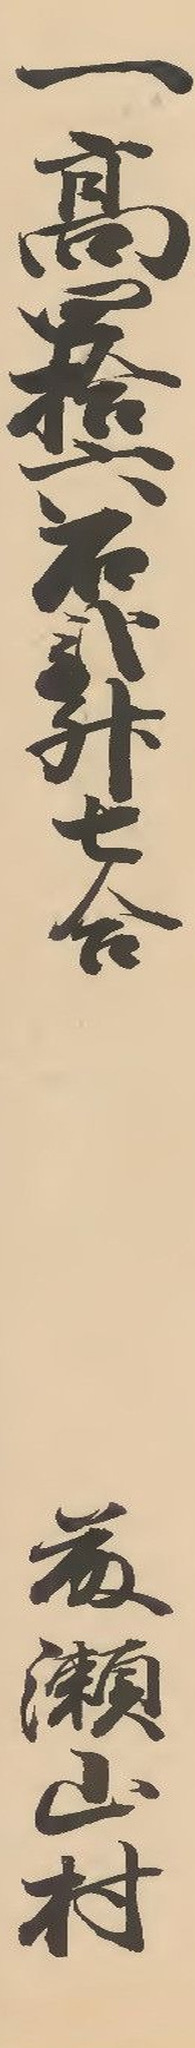一髙四拾六石弐升七合藤瀬山村
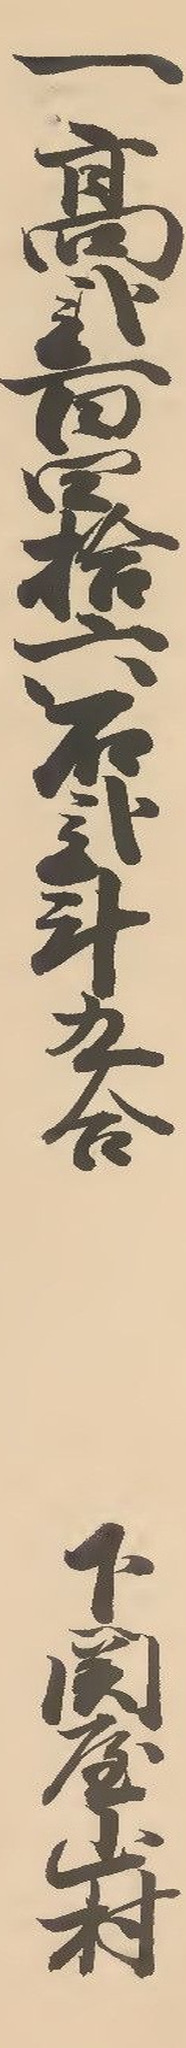一髙弐百四拾六石弐斗九合下関屋山村
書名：肥前国郷帳
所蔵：国立公文書館 National Archives of Japan
